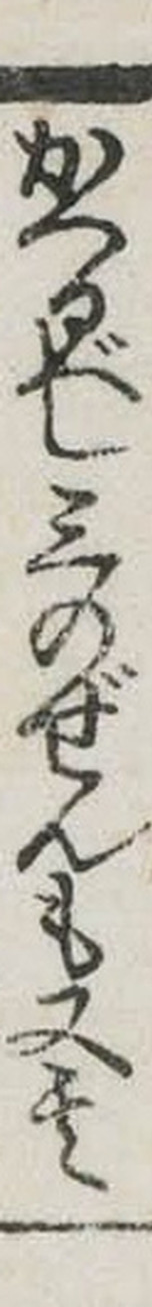かへるべし三のぜんも又其
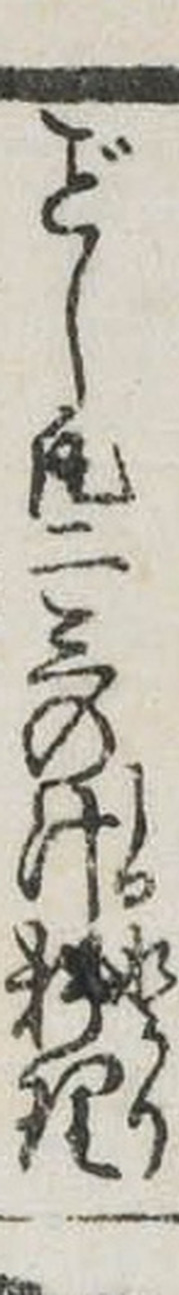ごとし凡二三の汁料理
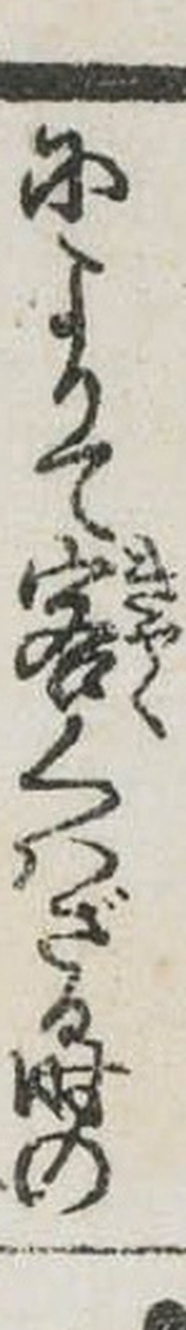によりて客くはざる時の
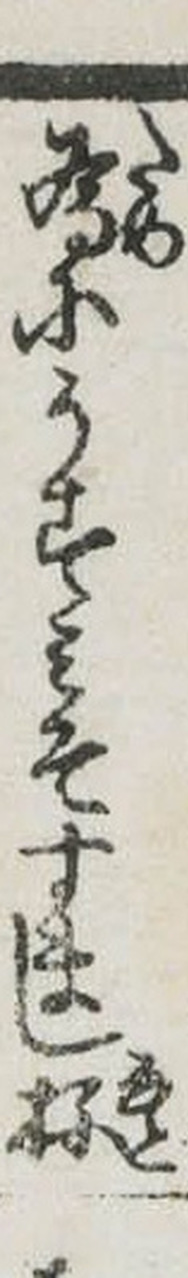為にうすみそすまし抔
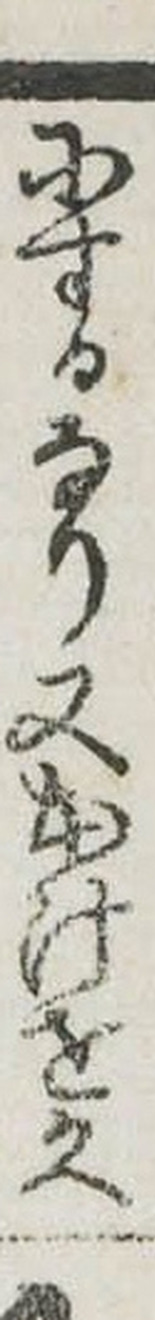にするなり又本汁をかへ
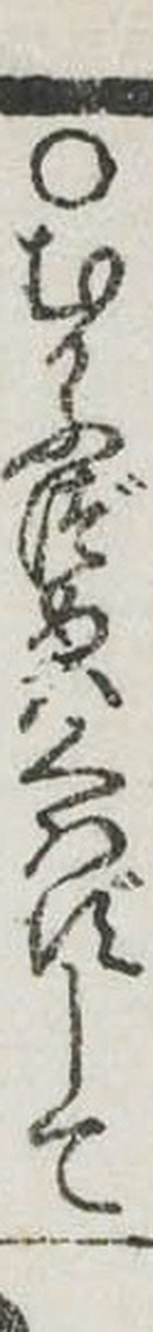○むかふづめはくはずして
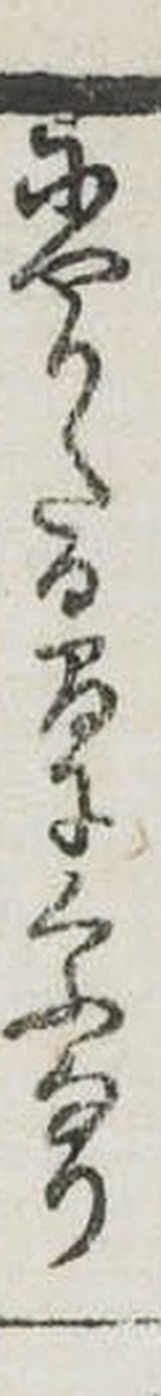にやりたる間にくふなり
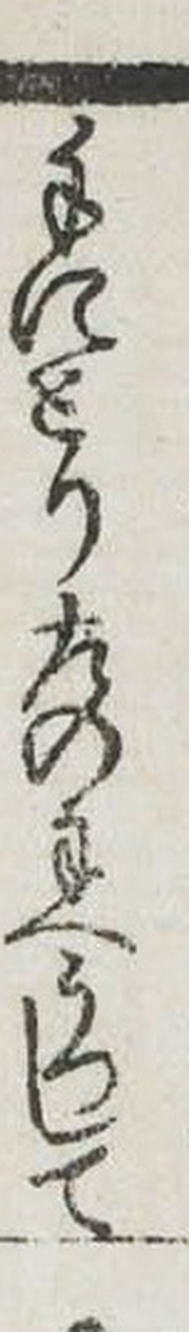手にとり左の手へうつして
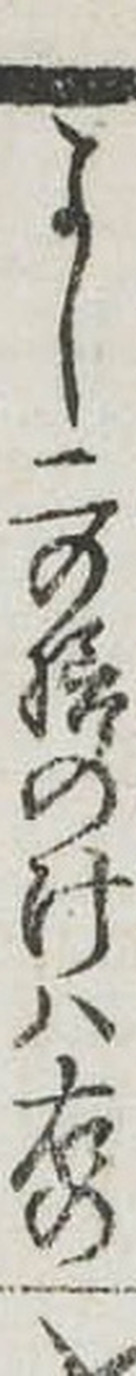よし二の膳の汁は右の
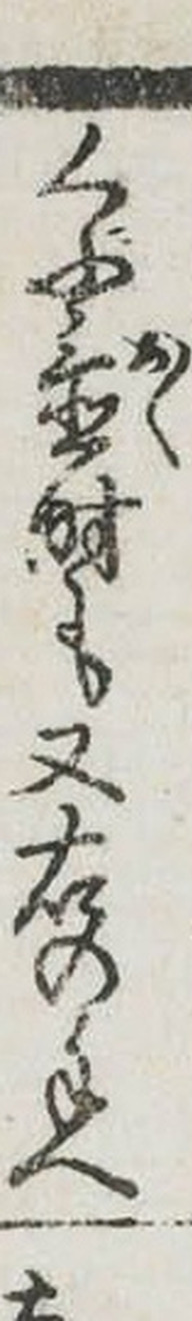くふ置時も又右の手へ
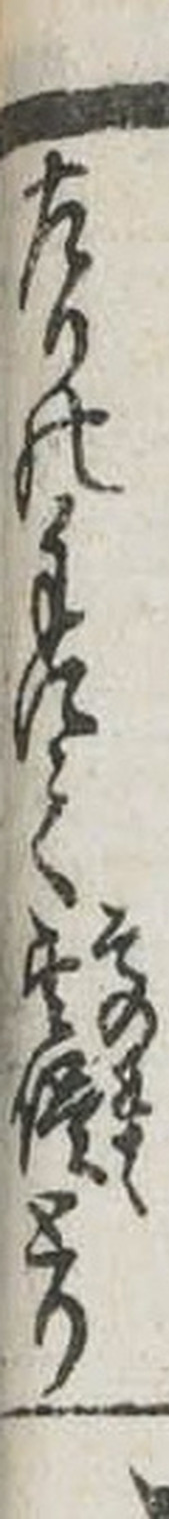左りの手にて其侭とり
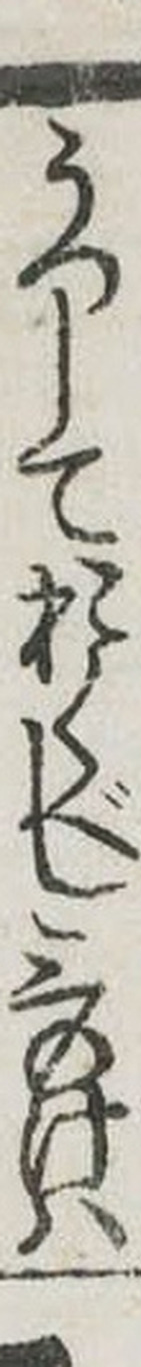うつしておくべし三の汁は
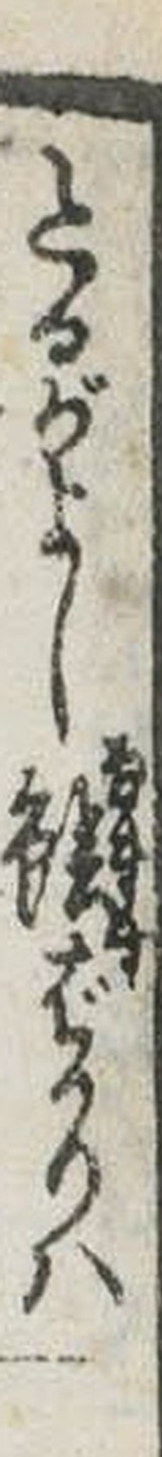とるがよし鱠ばかりは
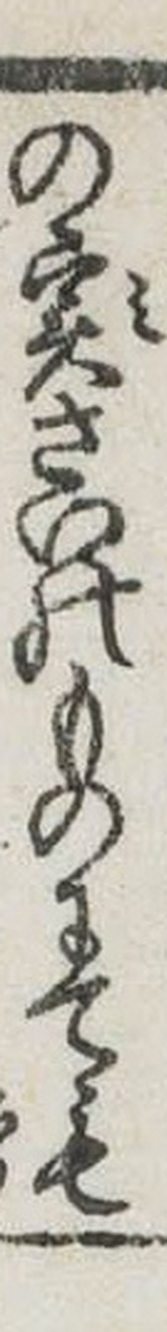の実さいのものにても
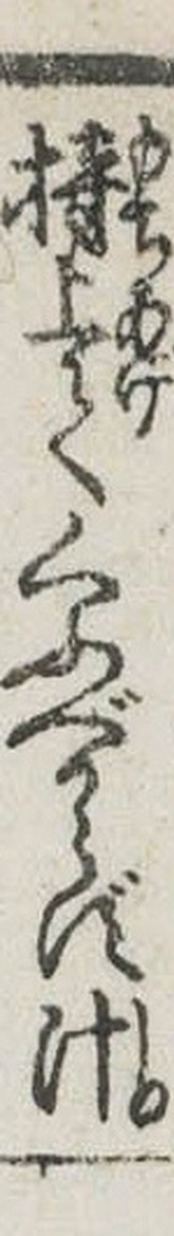持上てくふべからず汁
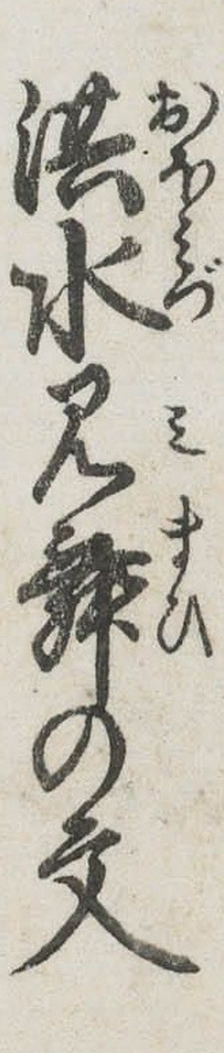洪水見舞の文
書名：頭書萬用婦人手紙之文言
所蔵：東京学芸大学教育コンテンツアーカイブ
